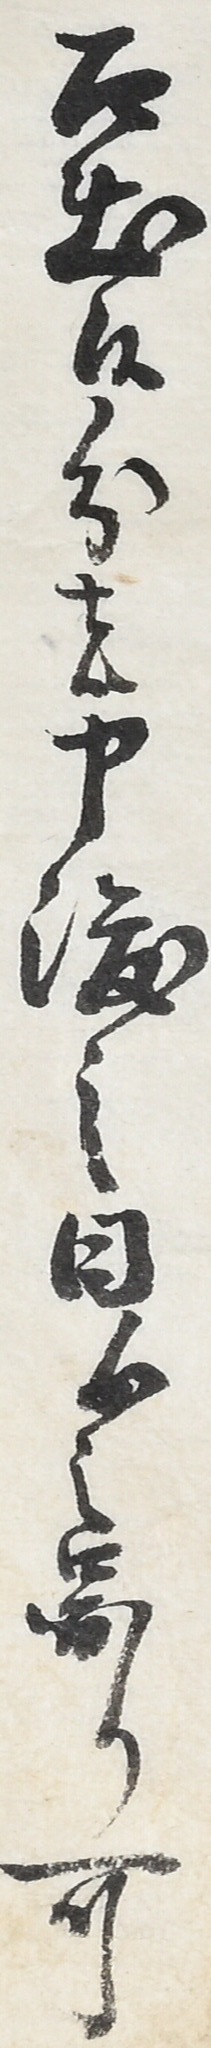召出候分は申渡之日ゟ之図り可

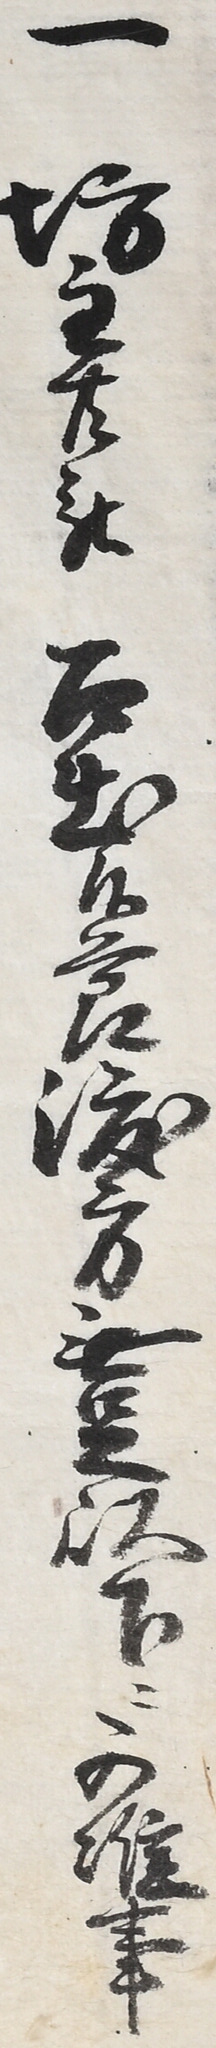一坊主共被召出候節渡方無足以下ニ可事
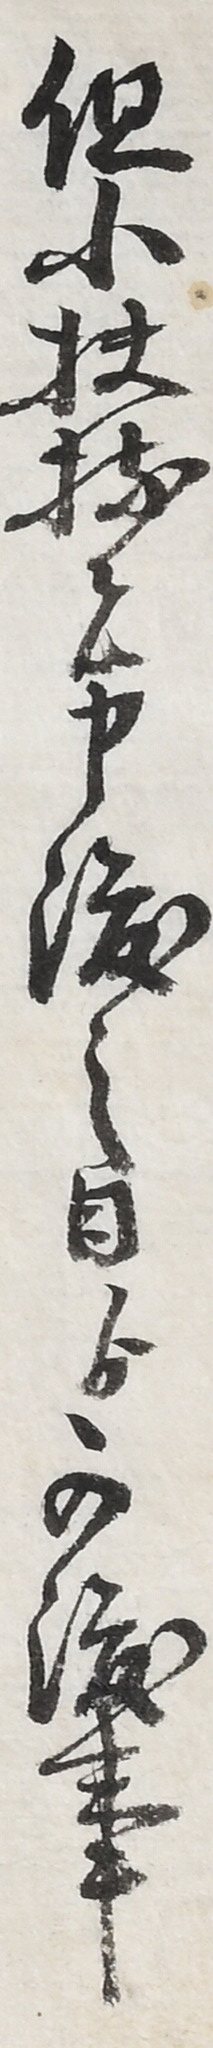但小扶持は申渡之月ゟ可渡事
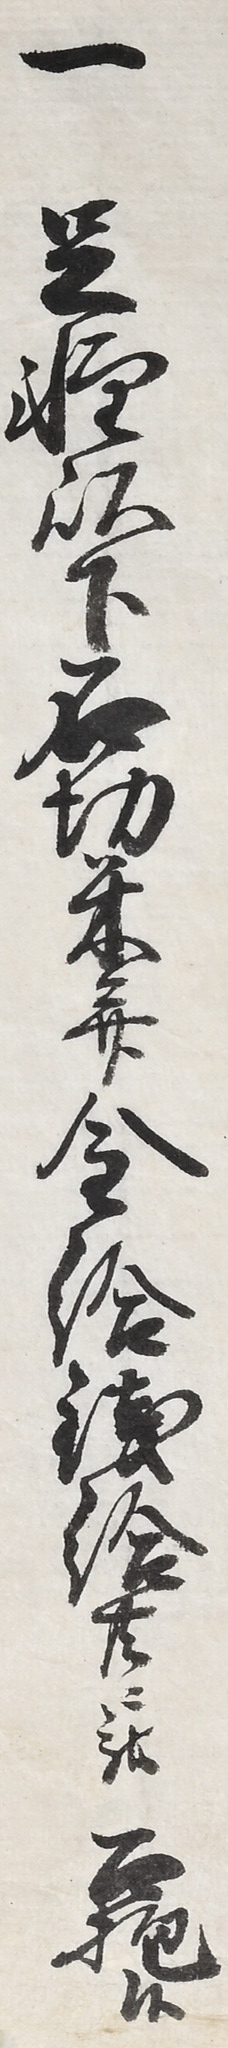一足軽頭以下石切米并金給銭共ニ被召抱候
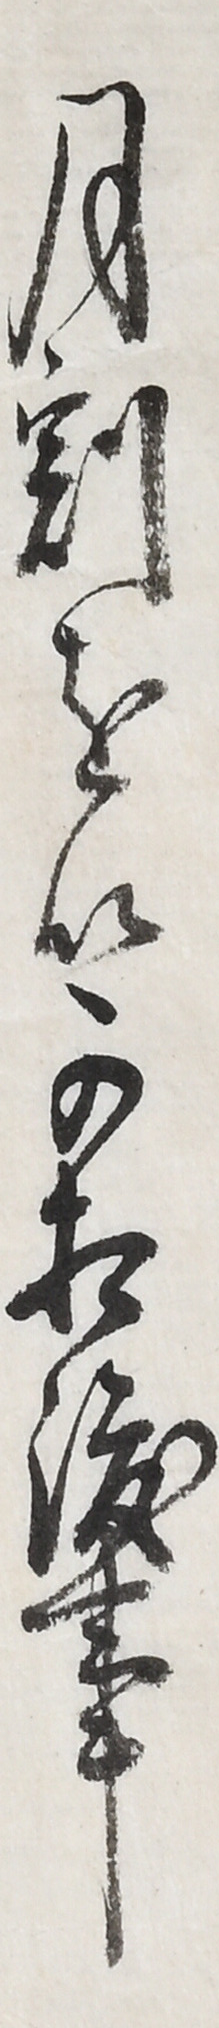月割を以可相渡事
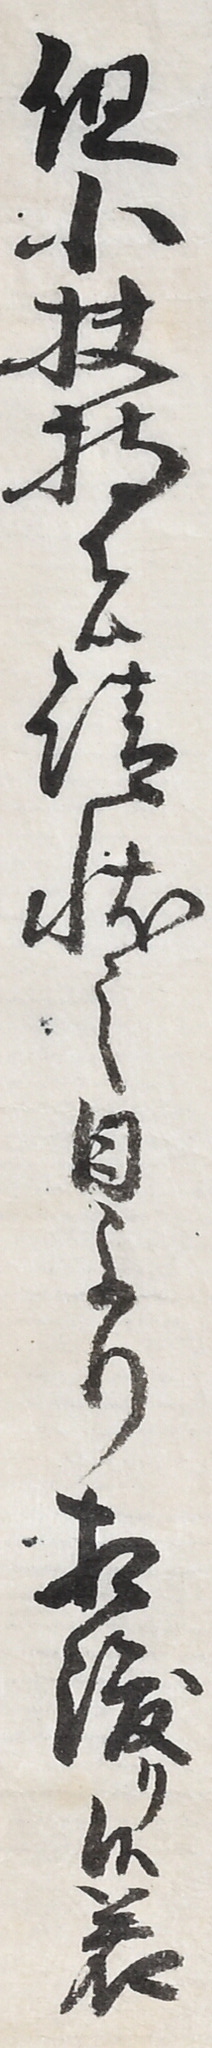但小扶持は請状之月より相渡り候若
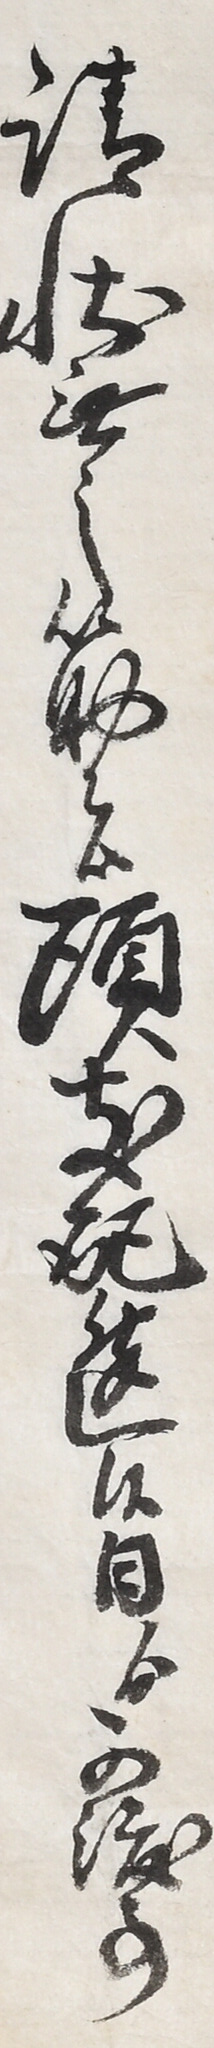請状無之筋は頭支配逢候月ゟ可渡事
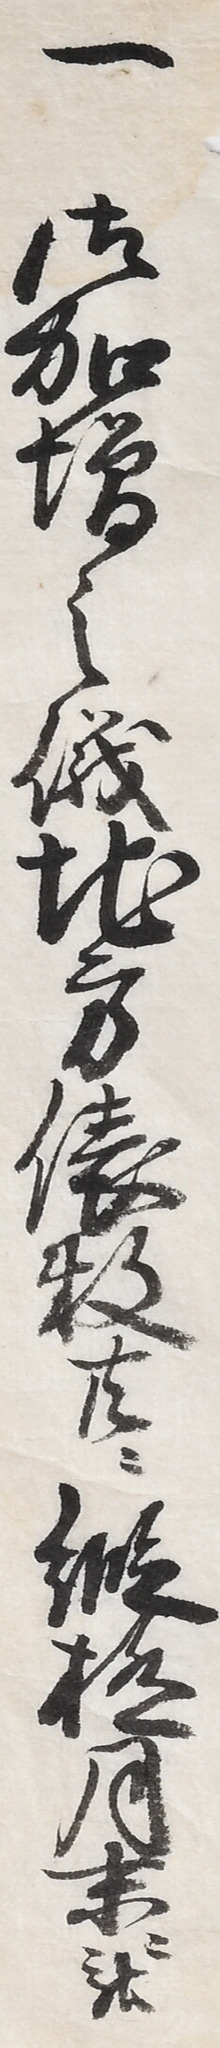一御加増之儀地方俵数共ニ縦極月末ニ被
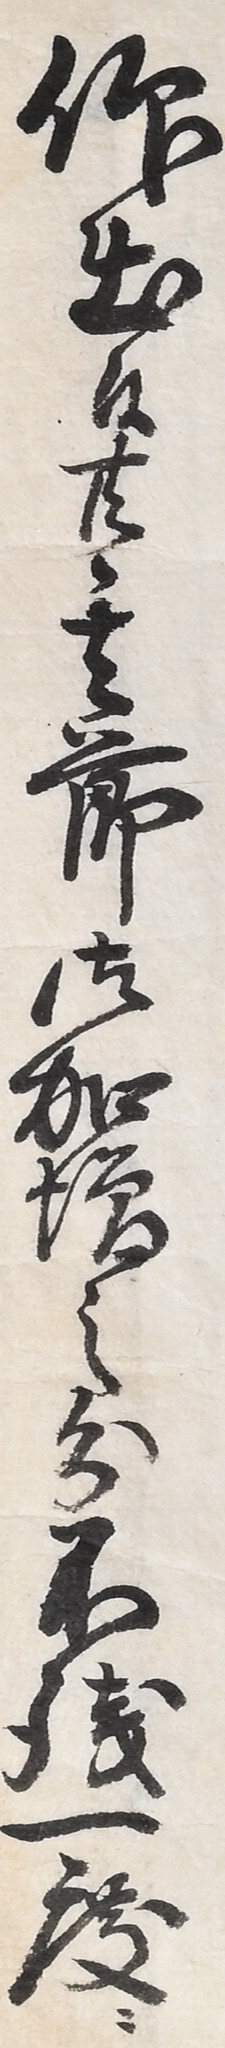仰出候共其節御加増之分不残一度ニ
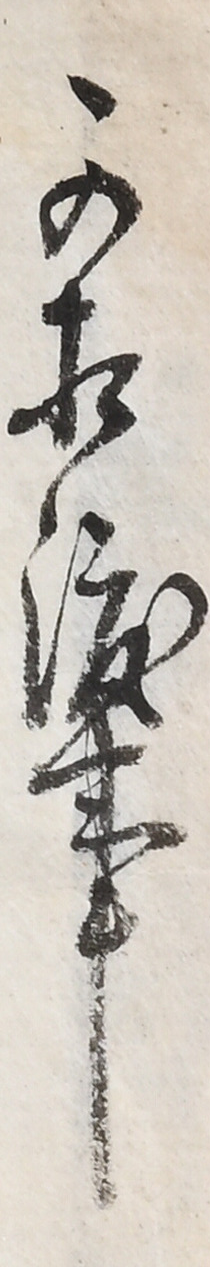可相渡事
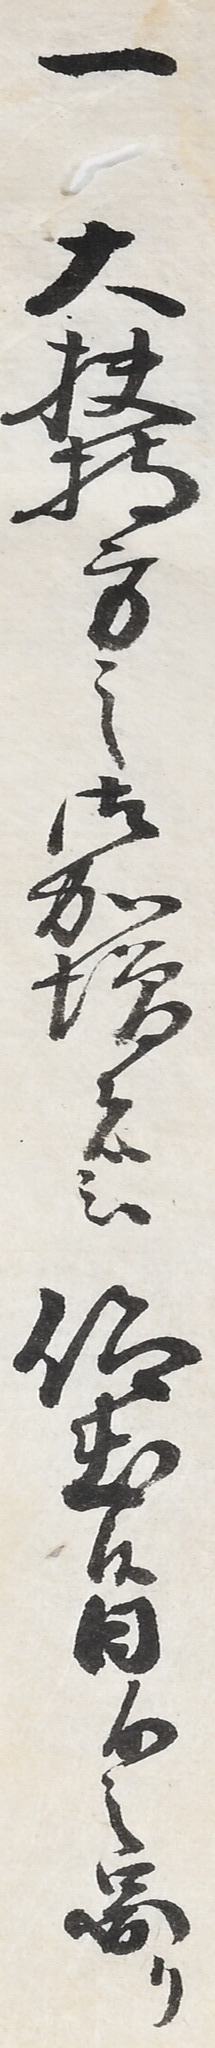一大扶持方之御加増は被仰出候月ゟ之図り
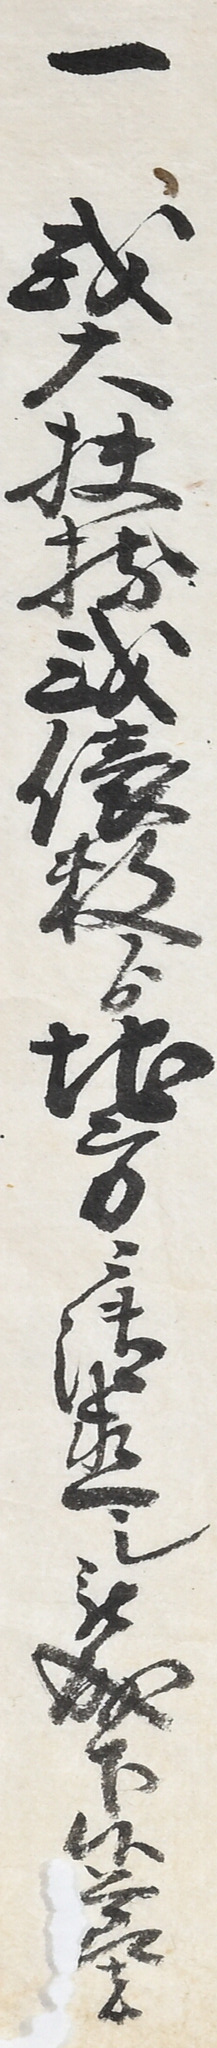一或大扶持弐俵数ゟ地方ニ御直シ被成下候節は
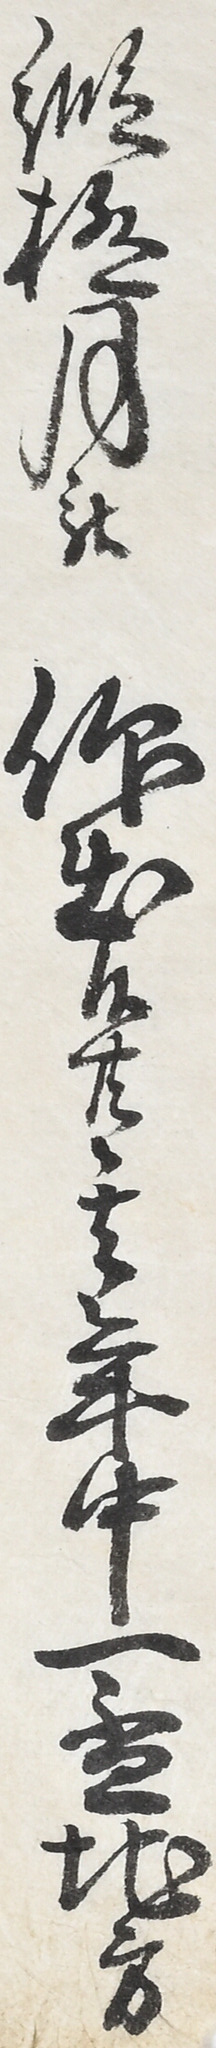縦極月被仰出候共其年中一盃地方
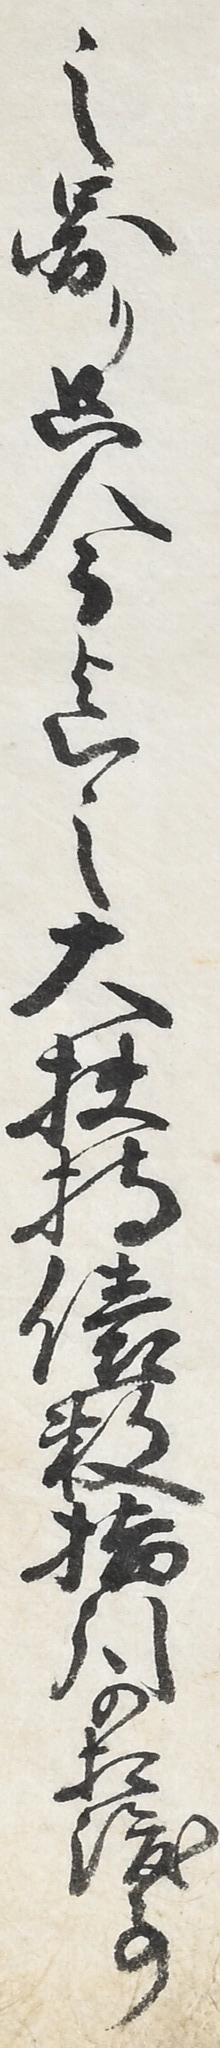之図り只今迄之大扶持俵数指引可相渡事
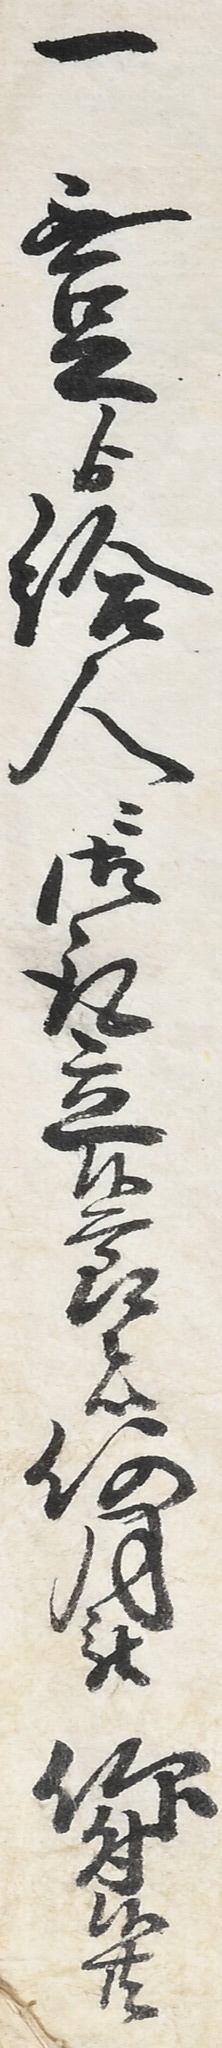一無足ゟ給人ニ御取立候節は何月被仰付候共

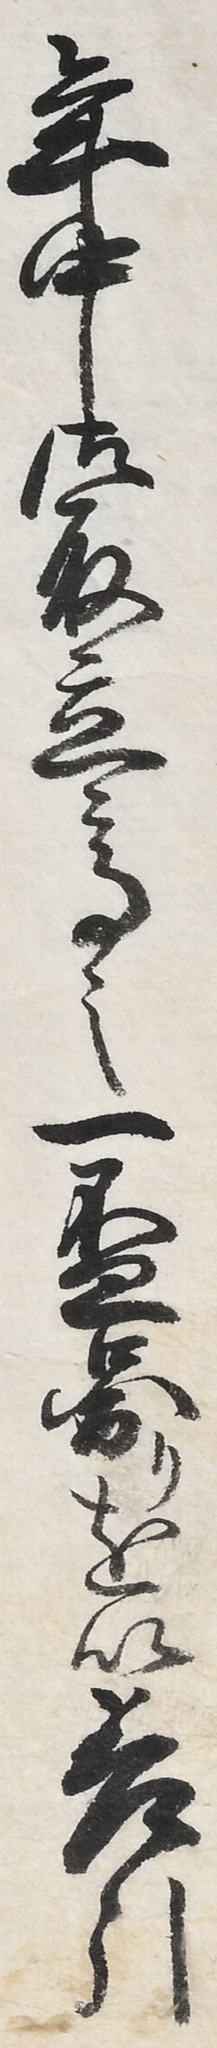年中御取立高之一盃図りを以差引
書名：御給分渡方之定
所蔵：伊那市立高遠町図書館・合同会社AMANE
